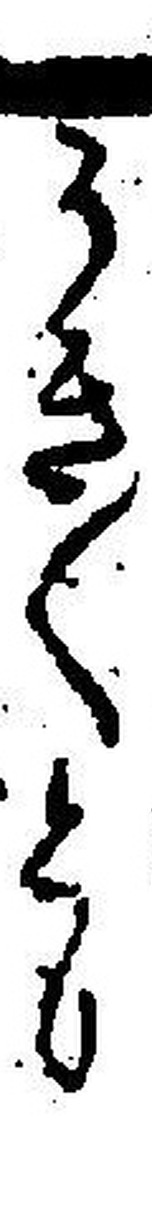うき〳〵とも
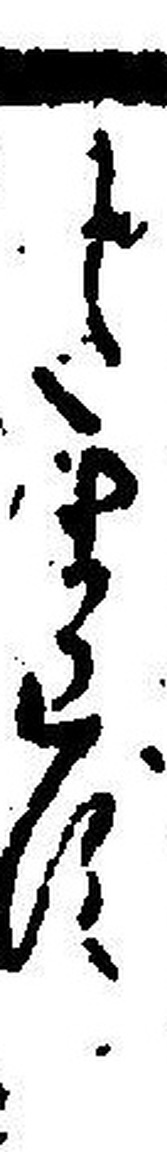したまわす
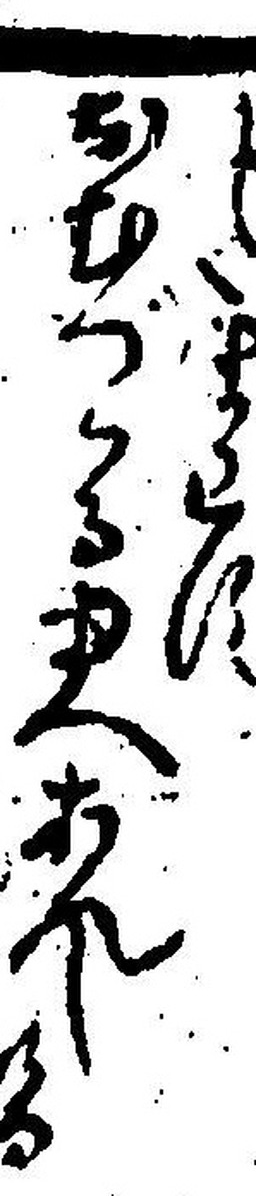おむづかるゆへあんし
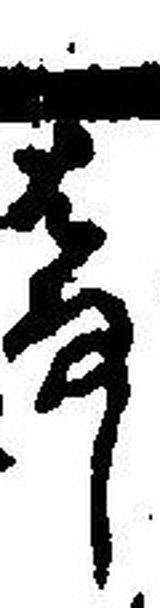はなし
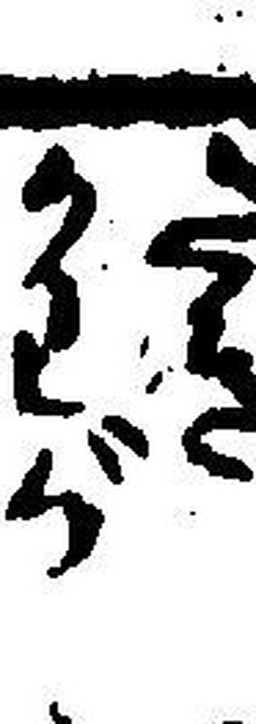かわが
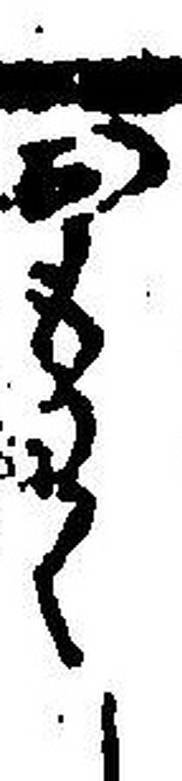おもわく
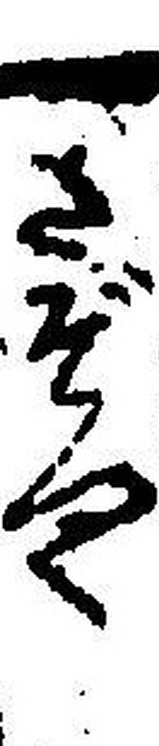さぞや
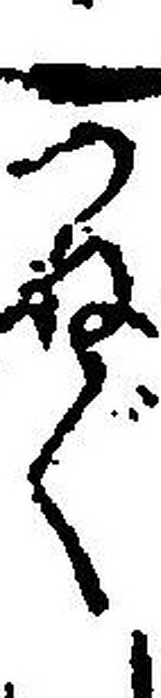つね〴〵
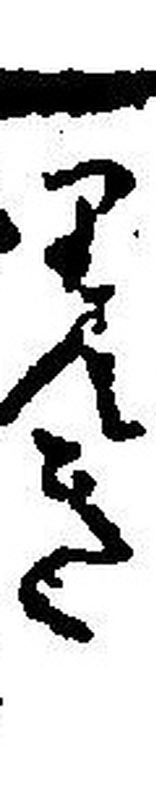りんき
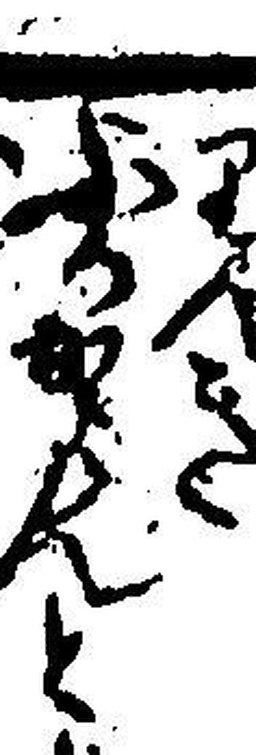ふかからんと
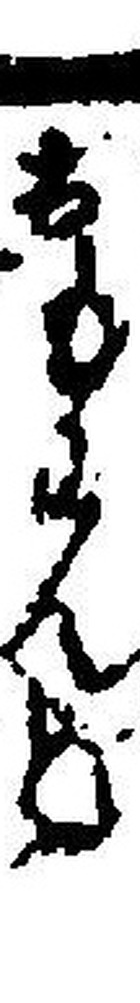おもわんと
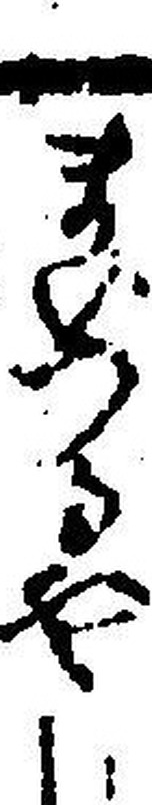まいづるや
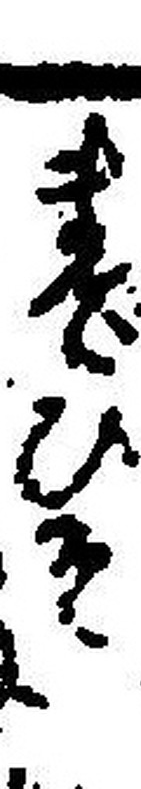までひそ
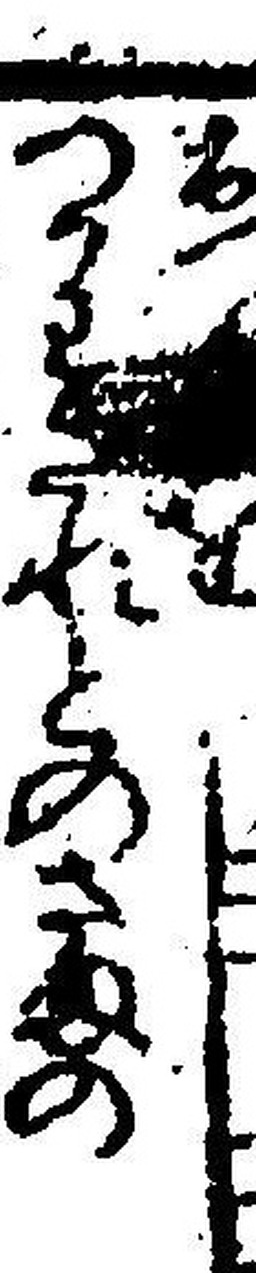ちぁわされとのさまの
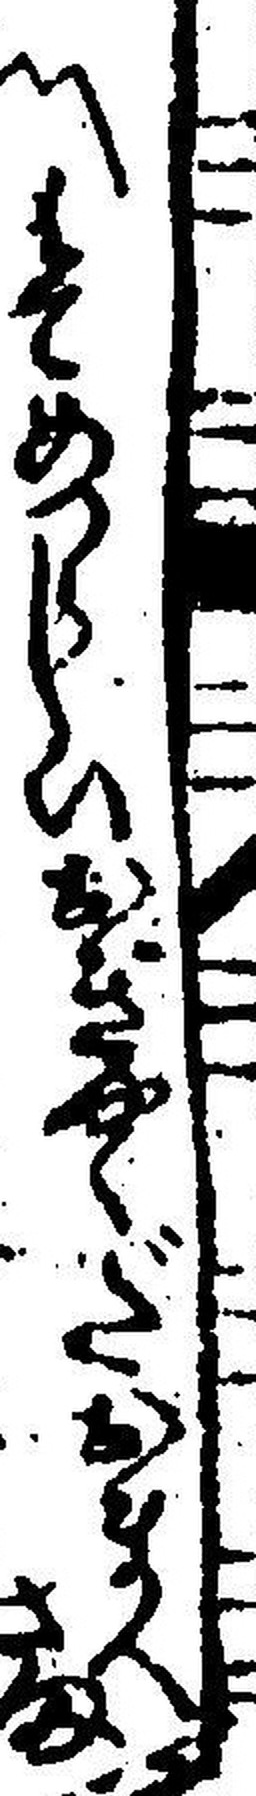〽はてめつらしいおきやくだおまへ
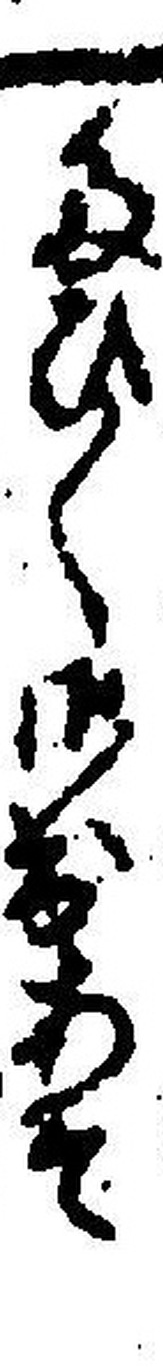たひ〳〵御出あそ
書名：御代参牛時詣 / 市場通笑作
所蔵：東京大学総合図書館 General Library in the University of Tokyo, JAPAN
